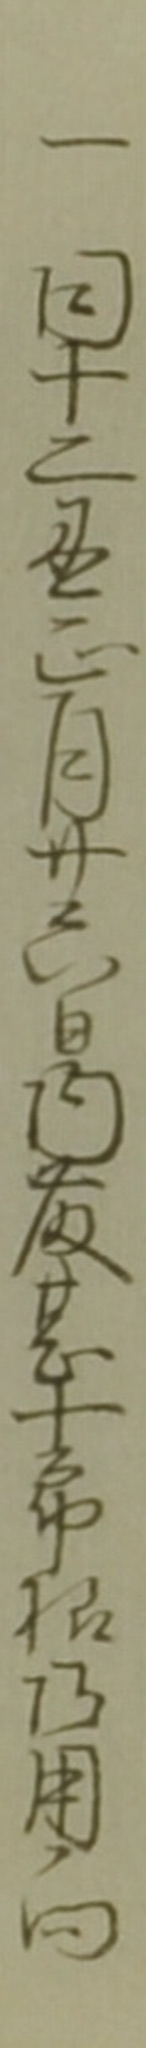一同十二丑正月廿六日内藤甚十郎様御用向
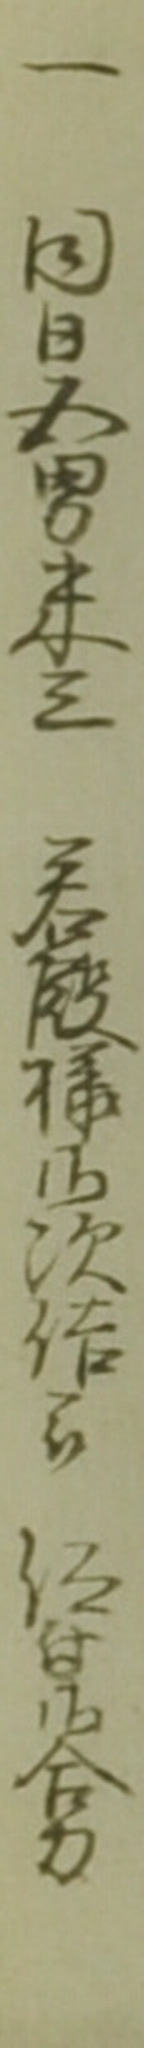一同日五男米三若殿様御次詰被仰付御合力
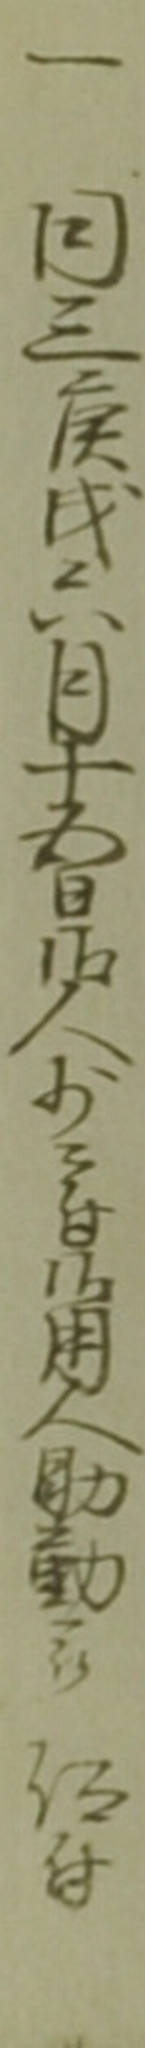一同三庚戌六月十五日御人少ニ付御用人助勤被仰付

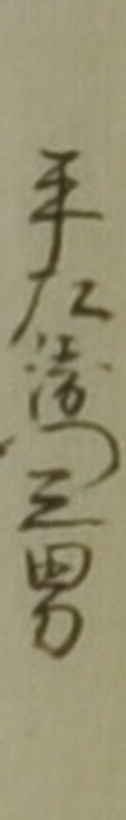平左衛門三男
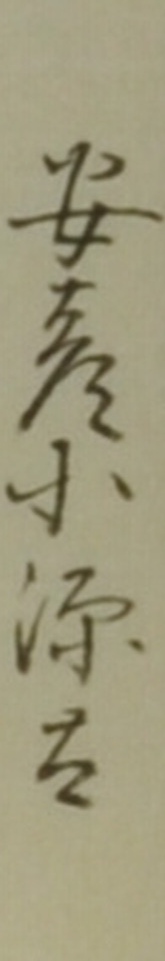安彦小源太
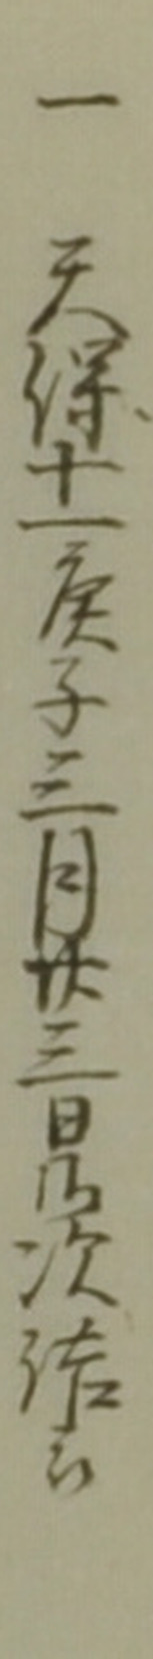一天保十一庚子三月廿三日御次詰被
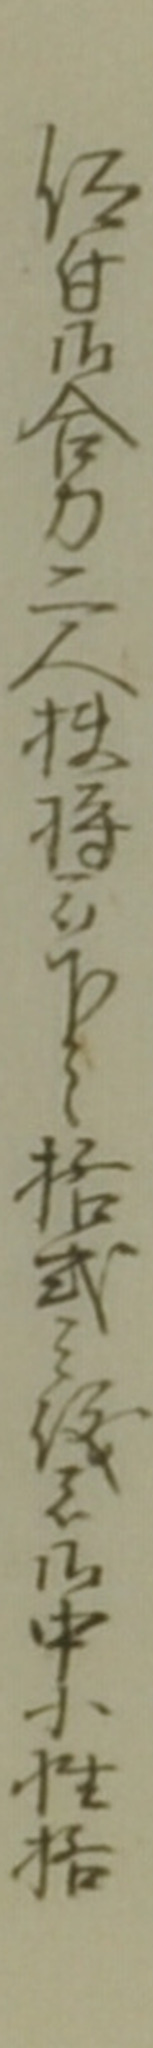仰付御合力二人扶持被下之格式之儀者御中小性格
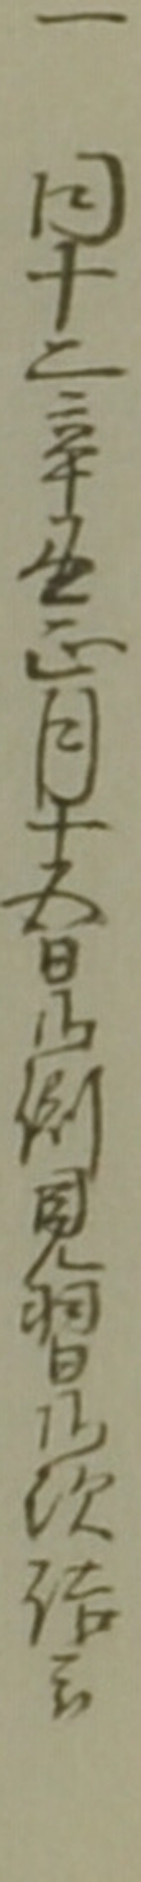一同十二辛丑正月十五日御側見習御次詰被
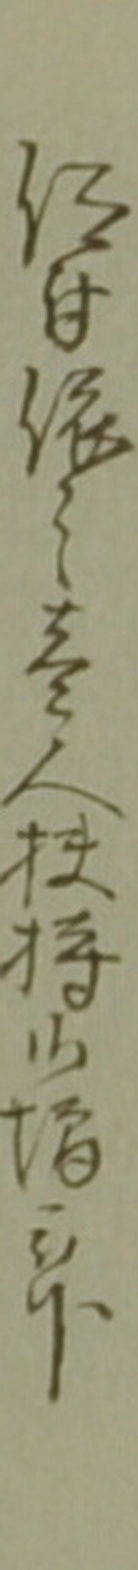仰付依之壱人扶持御増被下
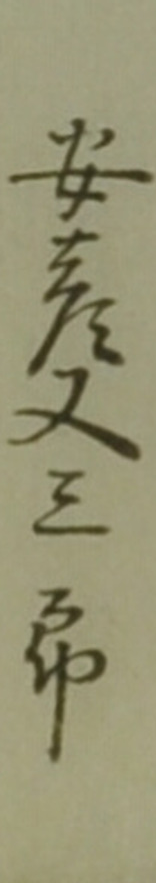安彦又三郎
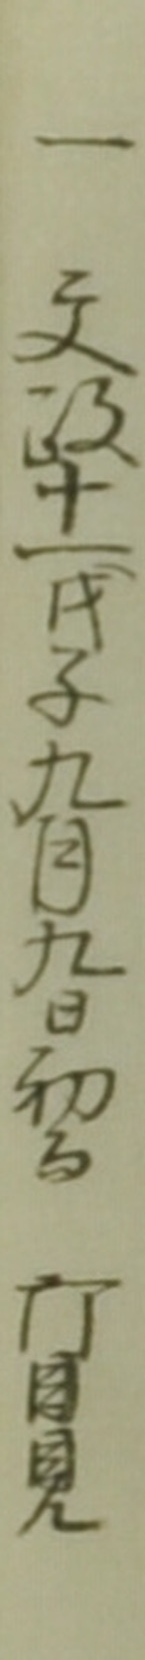一文政十一戊子九月九日初而御目見
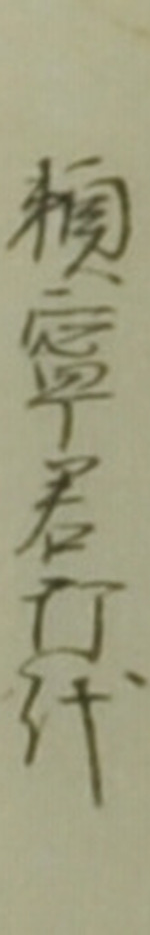頼寧君御代

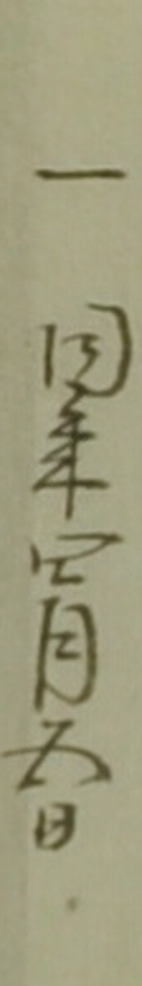一同年四月五日
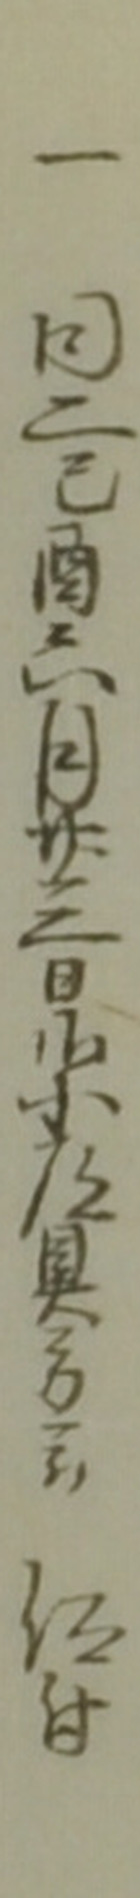一同二己酉六月廿三日御小道具方被仰付

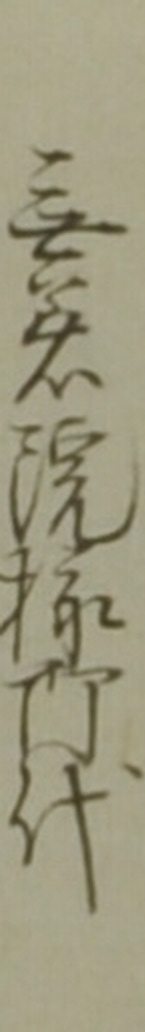無着院様御代
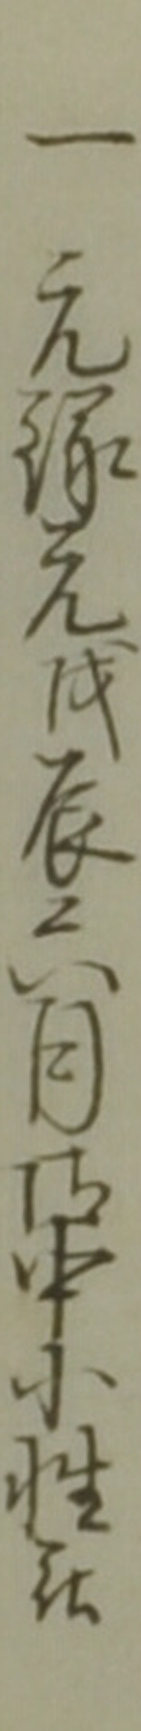一元禄元戊辰六月御中小性被
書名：給人諸士勤仕録（三）
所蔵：伊那市立高遠町図書館・合同会社AMANE
